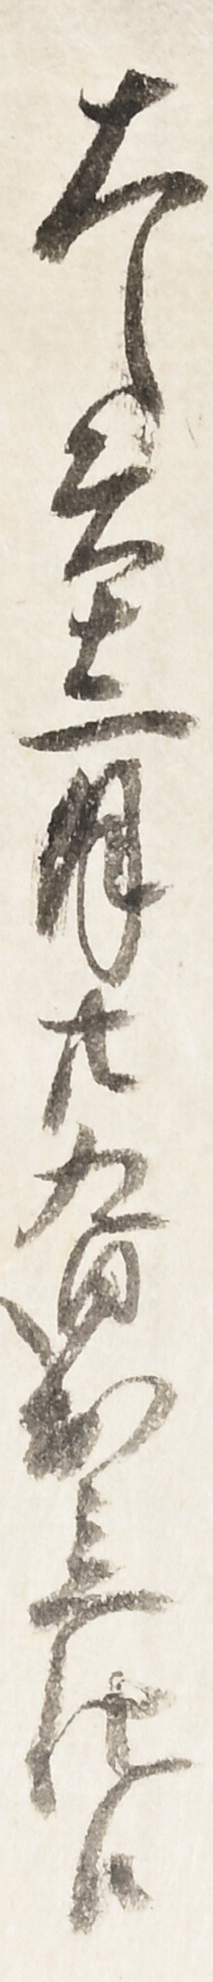右之者十二月廿九日出立仕候
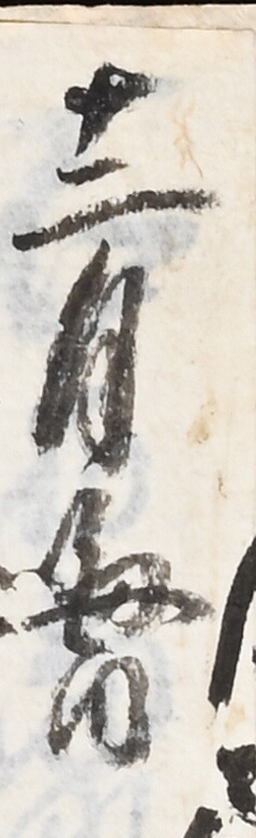十二月三人
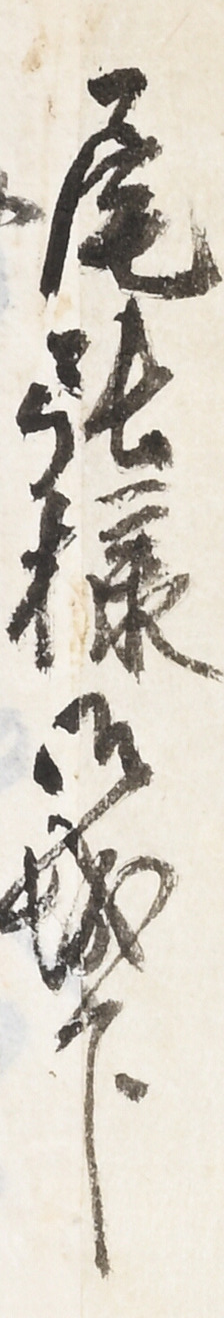尾張様御城下
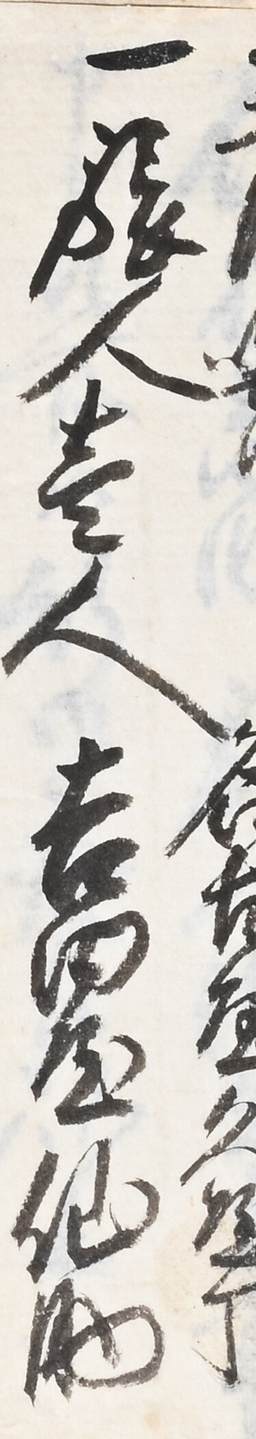一旅人壱人吉田屋仙助
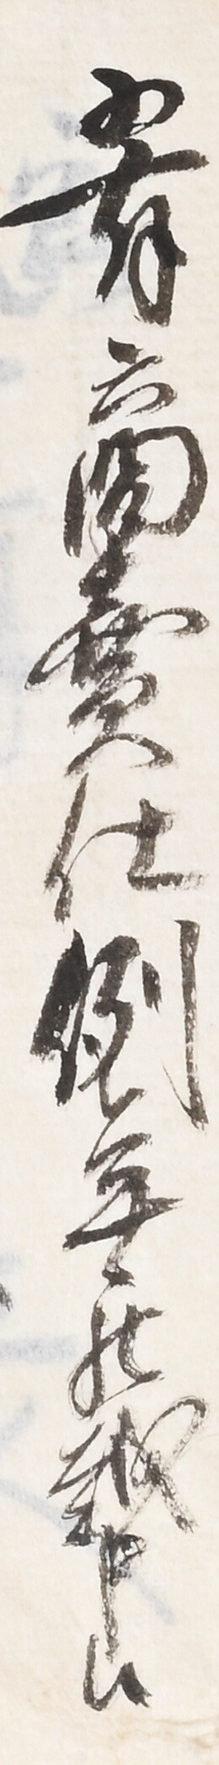肴商売仕例年罷越申候
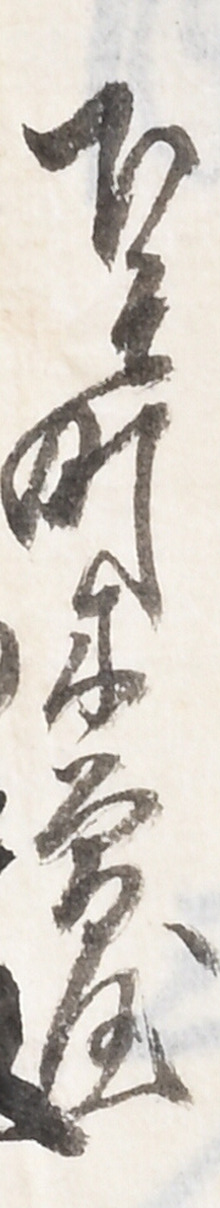下モ町木曽屋
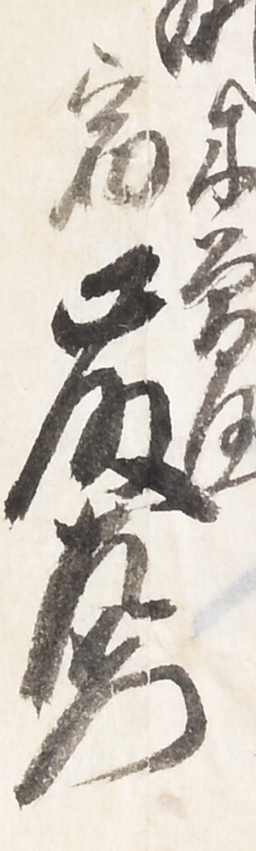宿籐左衛門
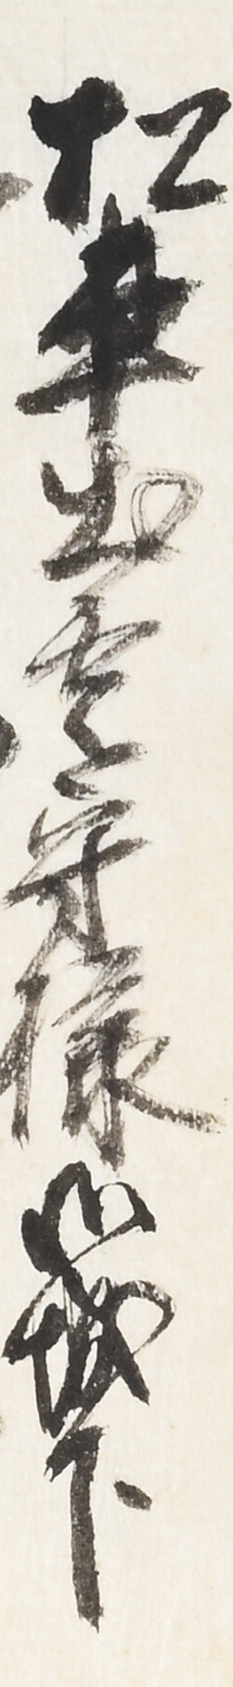松平出雲守様御城下
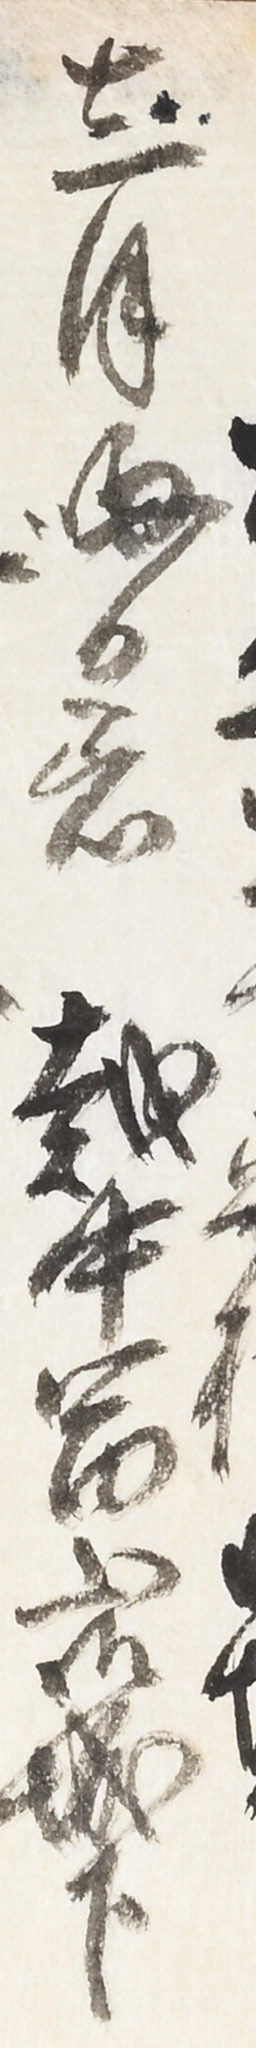十二月晦日着越中富山御城下
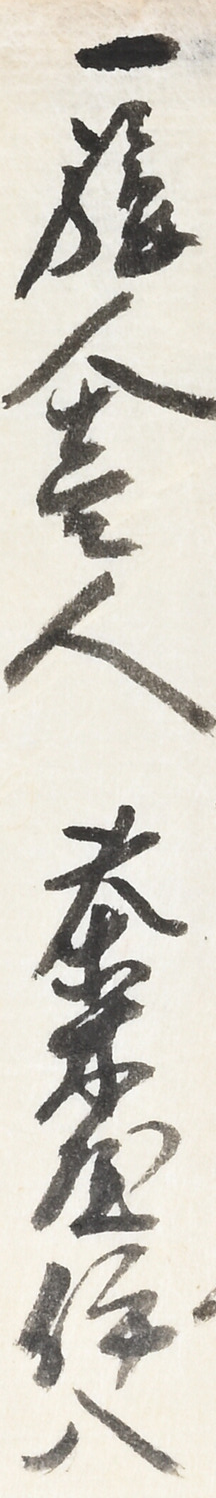一旅人壱人茶木屋伊八
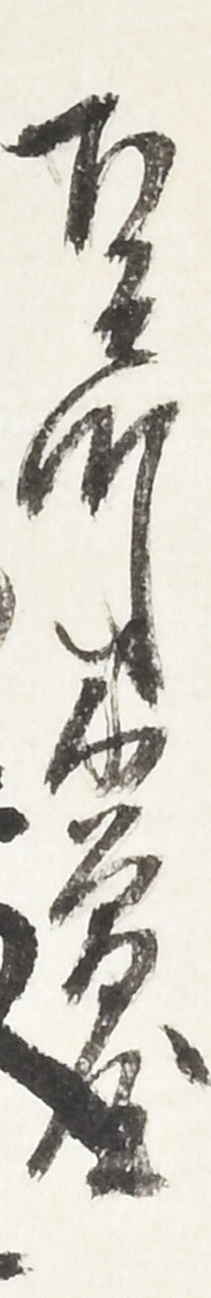下モ町木曽屋
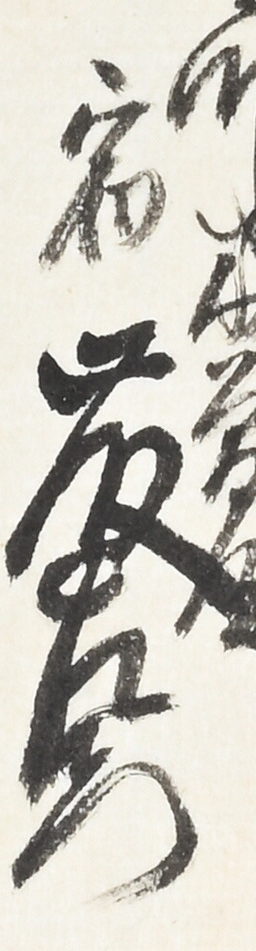宿籐左衛門
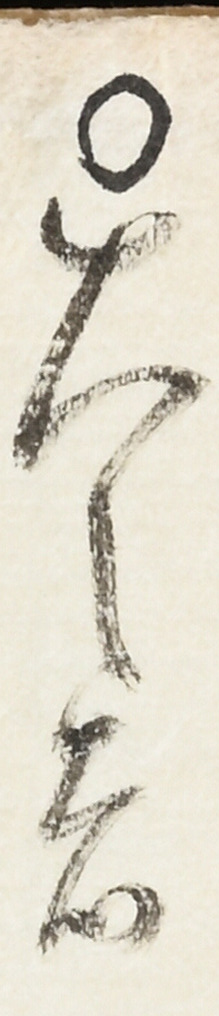〇右之者

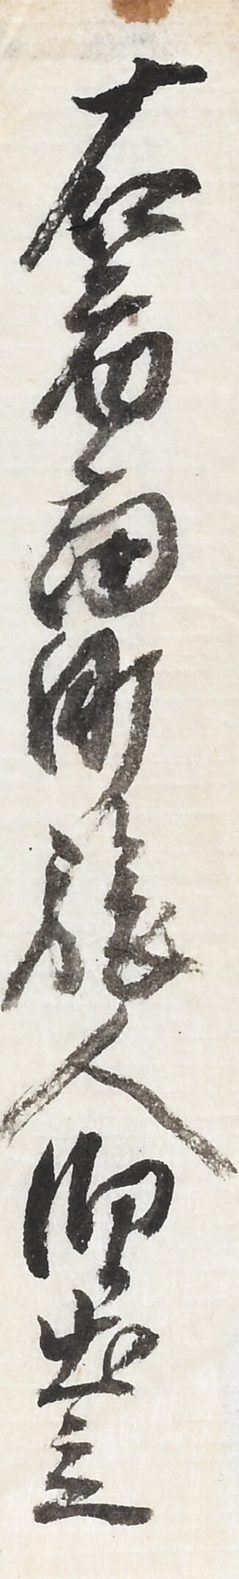右者当町旅人泊出立
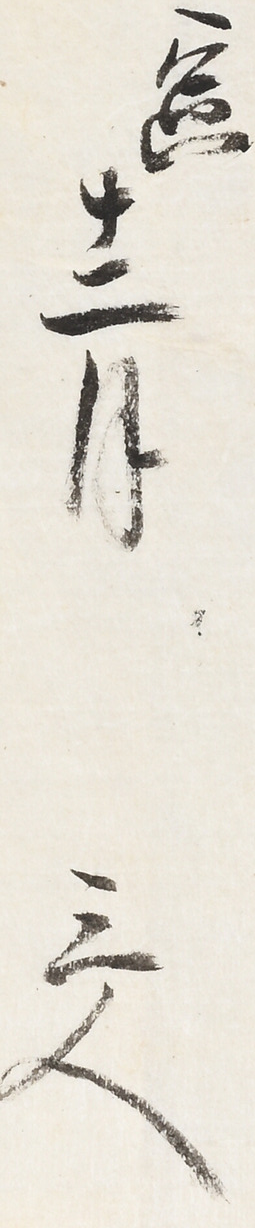十二月三人
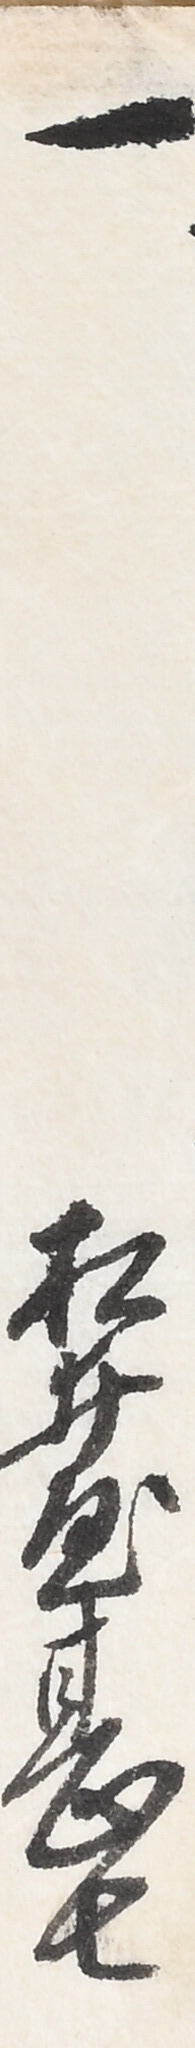一松井屋甚七
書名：旅人泊控帳
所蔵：伊那市立高遠町図書館・合同会社AMANE
